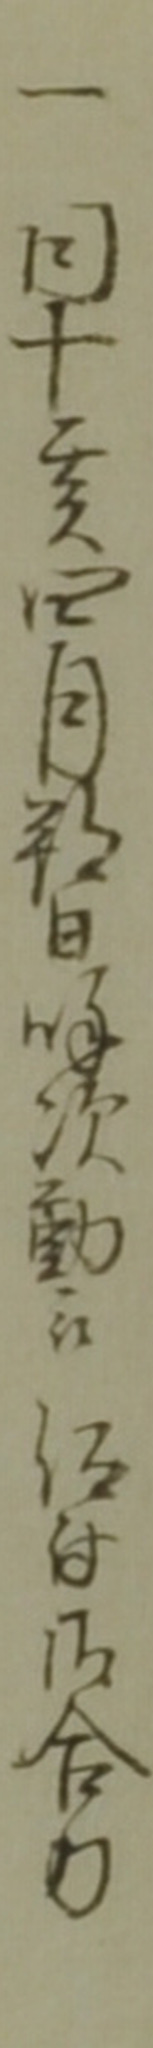一同十亥四月朔日呼次勤被仰付御合力
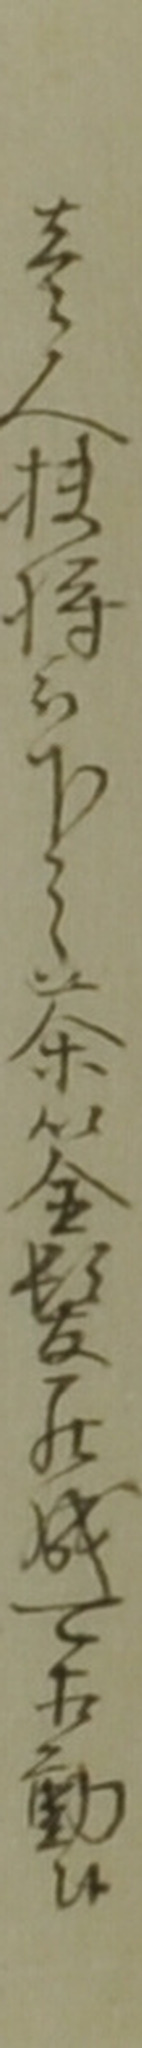壱人扶持被下之茶筌髪罷成可相勤候
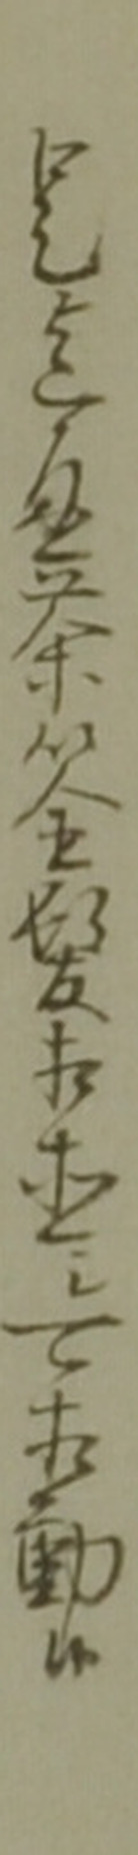是迄通茶筌髪相直シ可相勤候
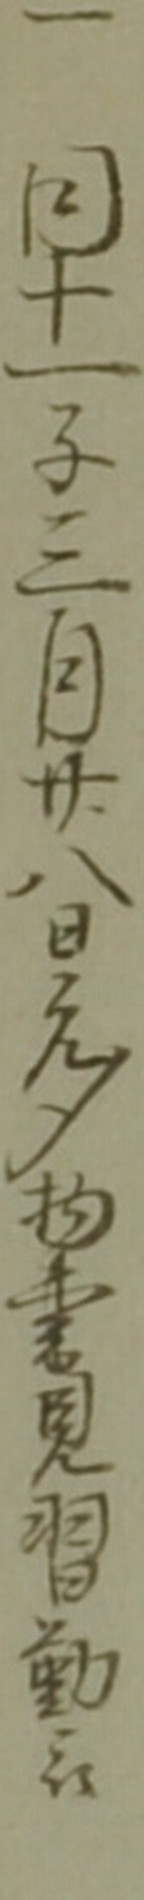一同十一子三月廿八日元〆物書見習勤被
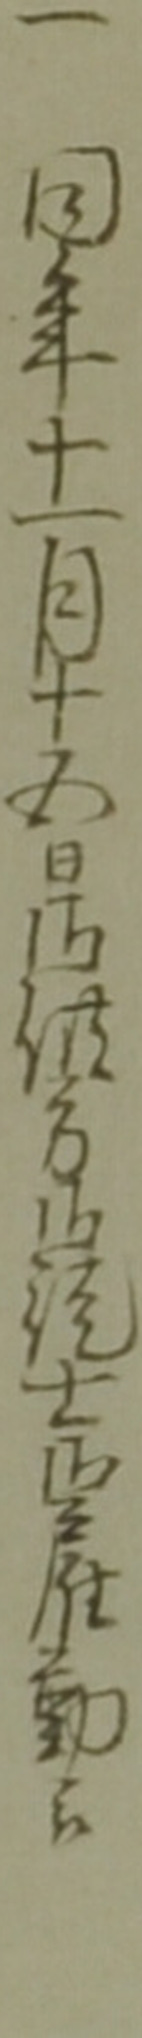一同年十一月十五日御供方御徒士御雇勤被
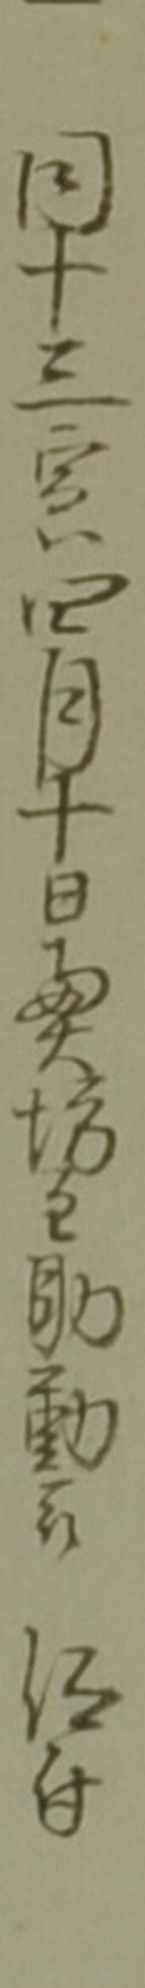一同十三寅四月十日奥坊主助勤被仰付
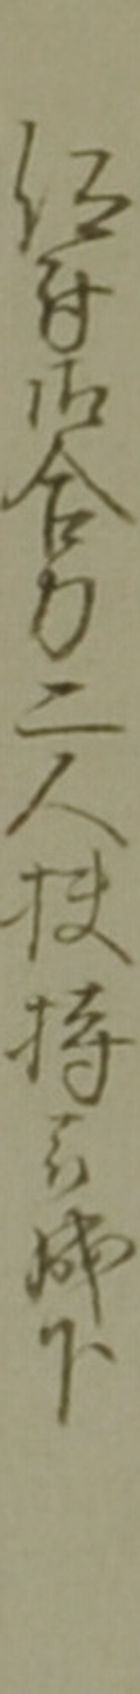仰付御合力二人扶持被成下
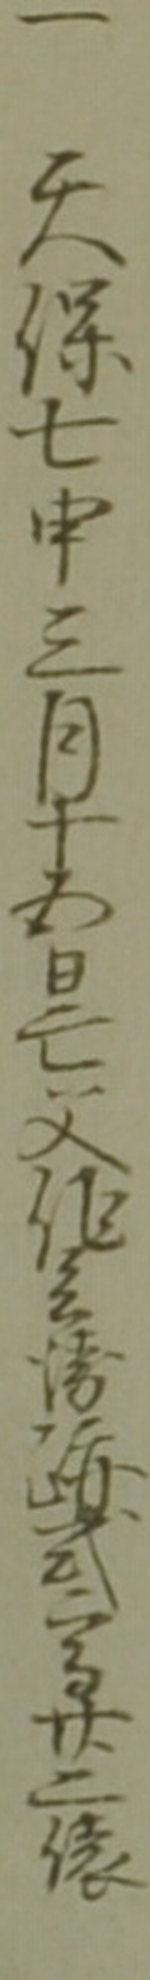一天保七申三月十五日亡父作兵衛跡式高廿二俵
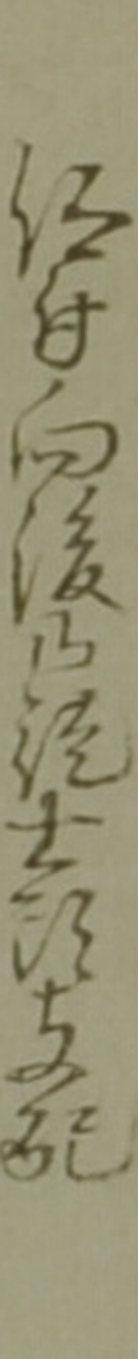仰付向後御徒士頭支配
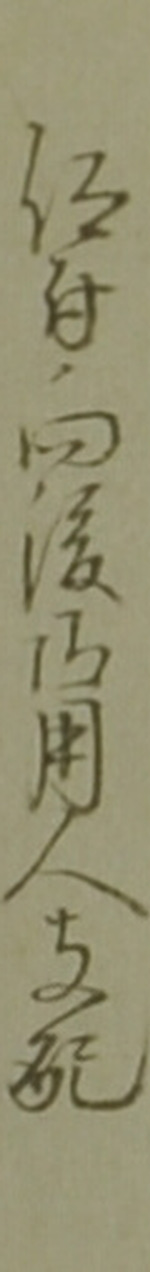仰付向後御用人支配

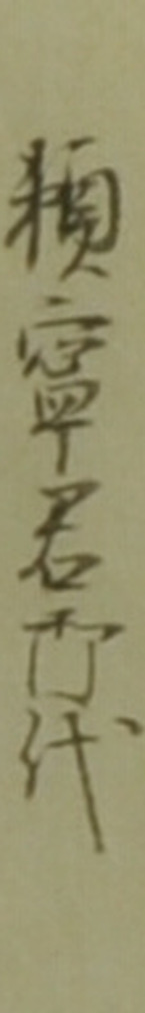頼寧君御代
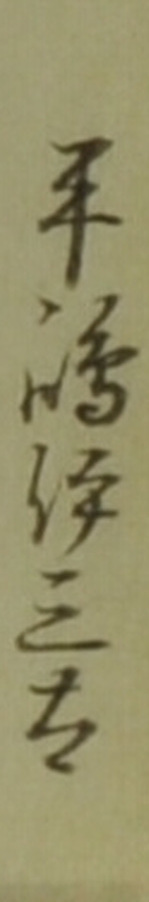平嶋伊三太

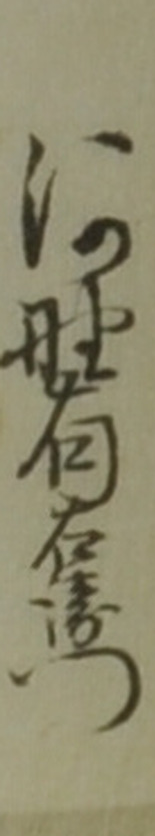河野有右衛門
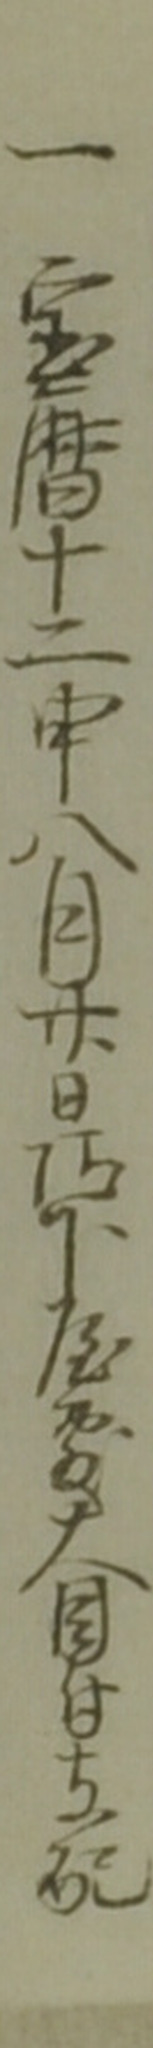一宝暦十二申八月廿日御下屋敷大目付支配
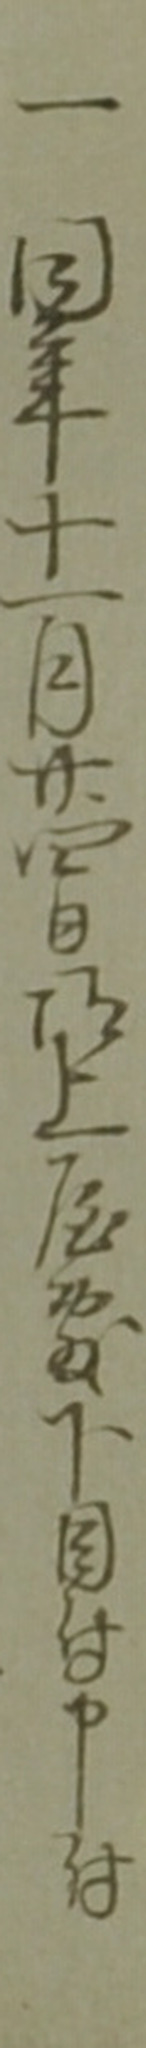一同年十一月廿四日御上屋敷下目付申付
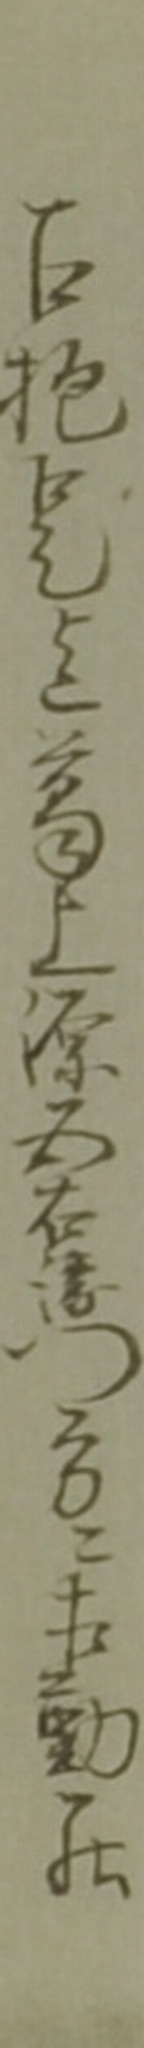召抱是迄葛上源五右衛門方ニ相勤罷
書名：無足諸士勤仕録（三）
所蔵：伊那市立高遠町図書館・合同会社AMANE
